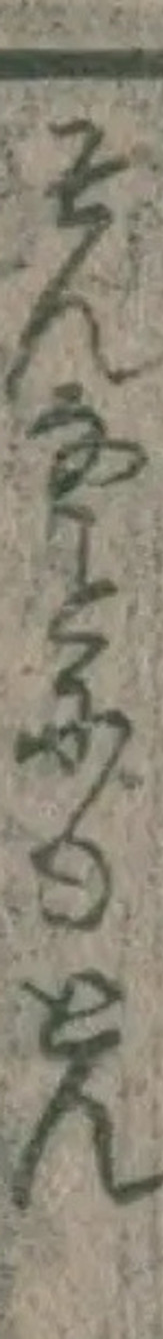そんなことにもとん
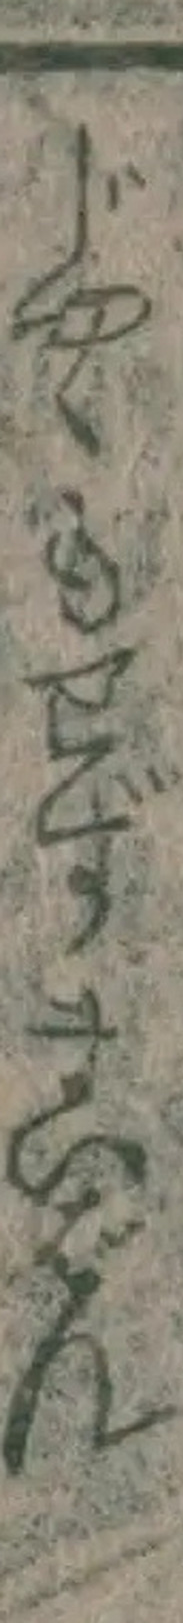じやくもせずまいばん
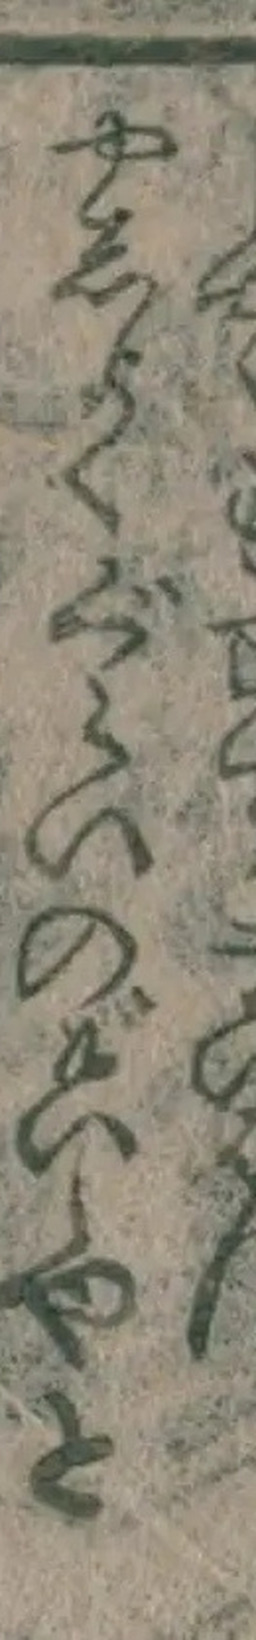やしょくぐらいのげいしやと
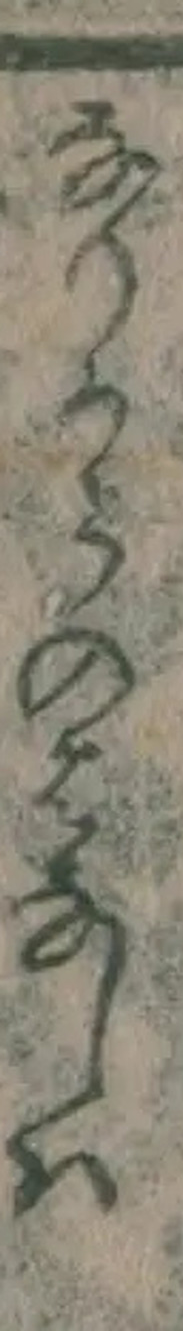なりからのはなしは
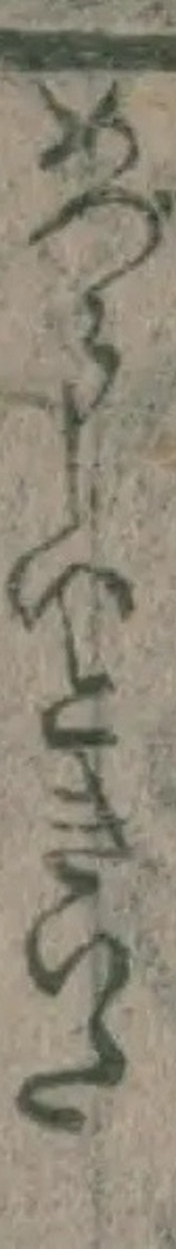めずらしいときいた
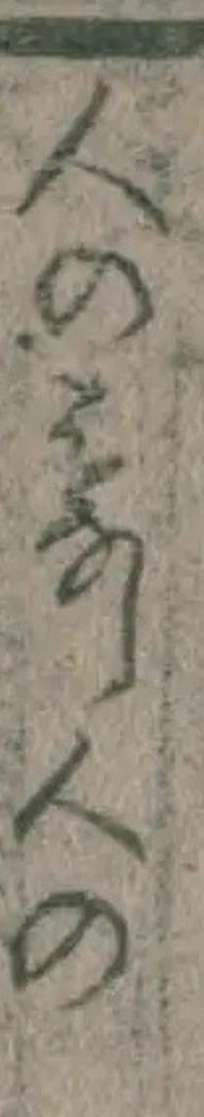人のはなし人の
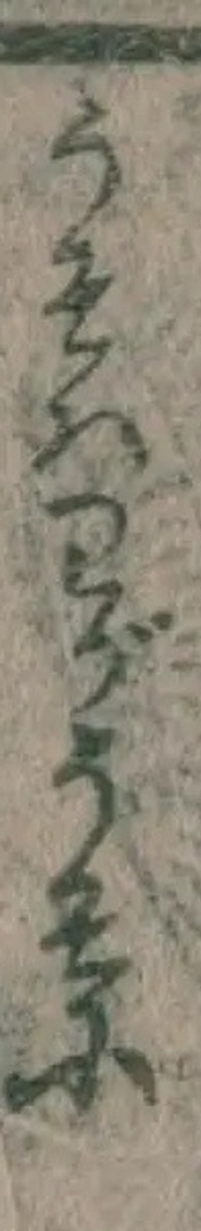うそはわがうそに
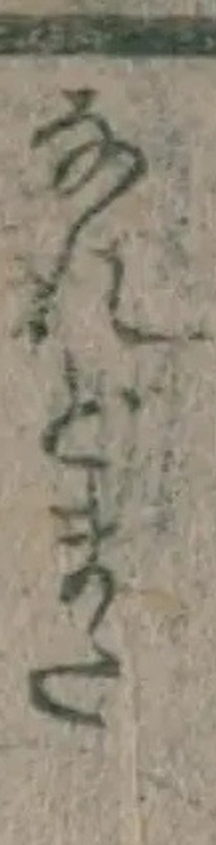なれどまた
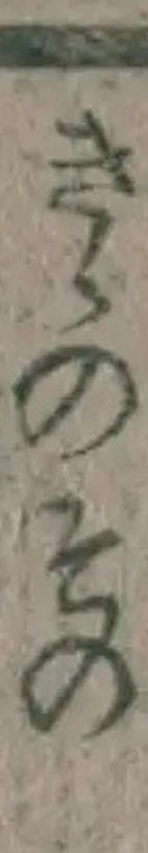きらのその
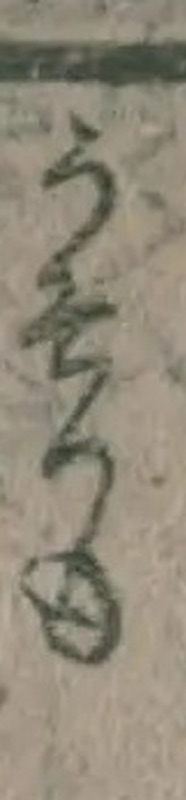うそかも
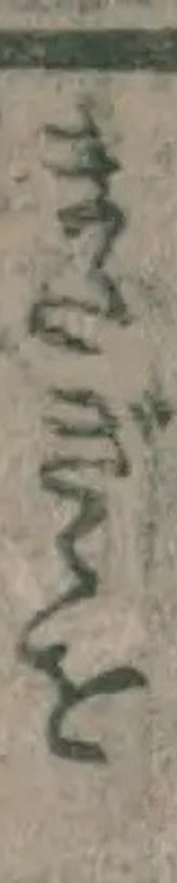またぎらを
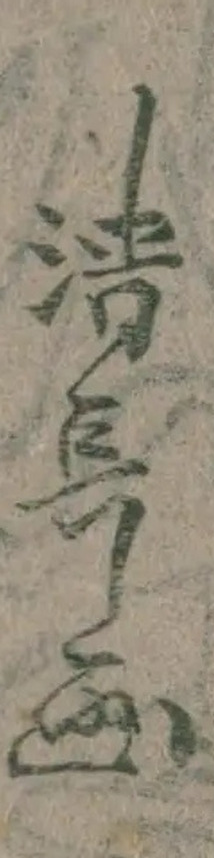清長画
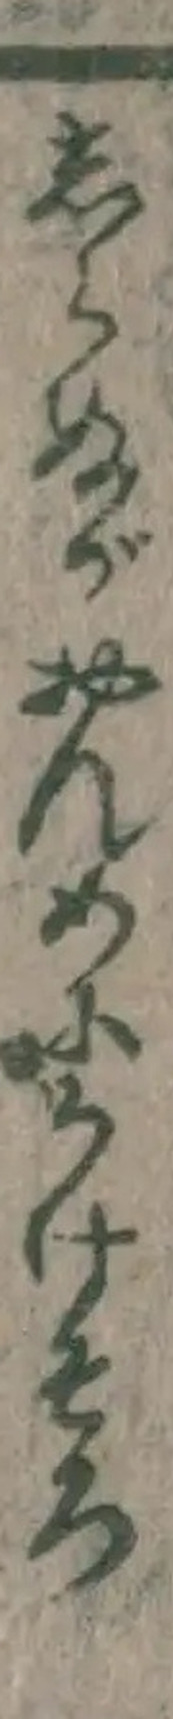しらぬがおんめにかけそろ
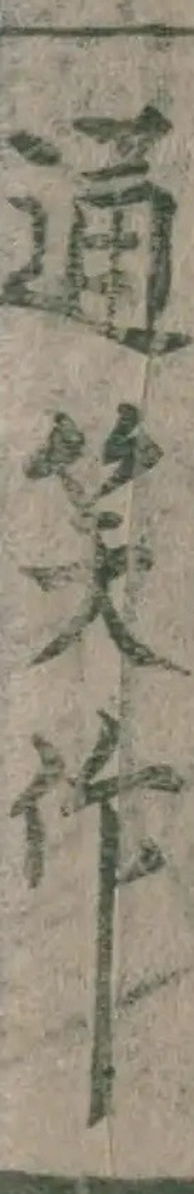通笑作
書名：縦筒放唐の噺 3巻
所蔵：国立国会図書館 National Diet Library, JAPAN
